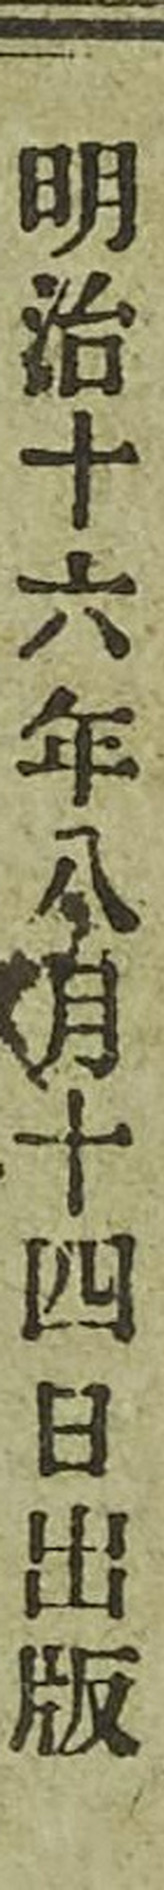明治十六年八月十四日出版
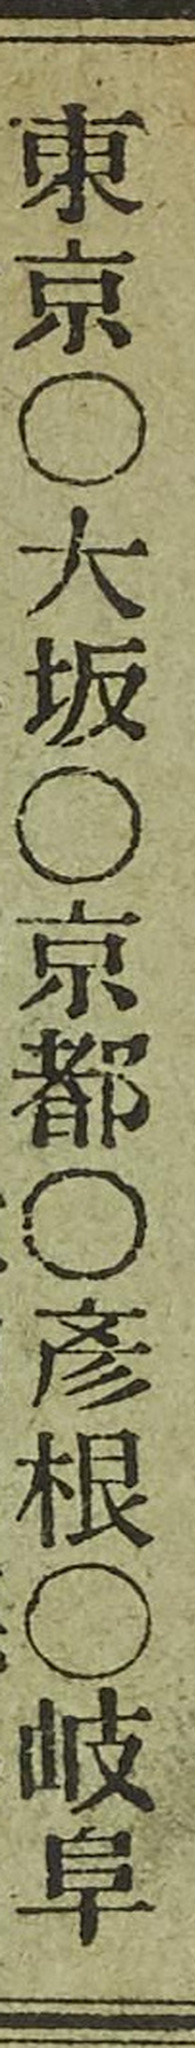東京○大坂○京都○彦根○岐阜
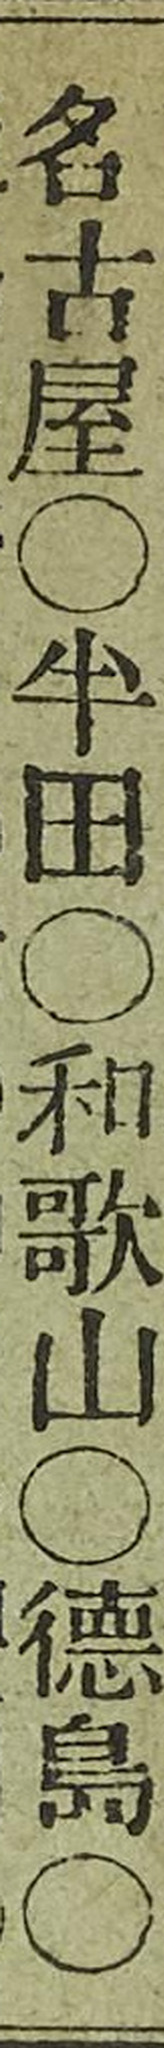名古屋○半田○和歌山○徳島○
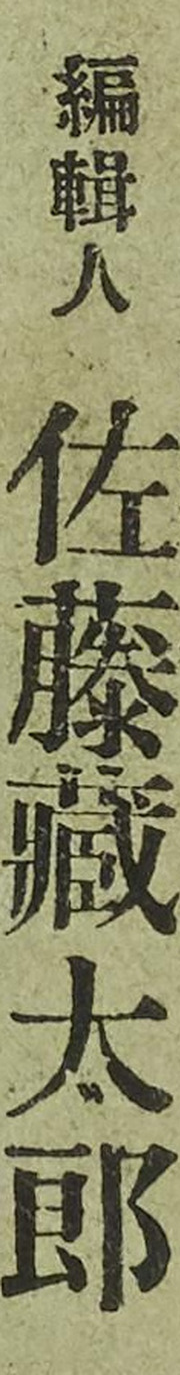編輯人佐藤蔵太郎
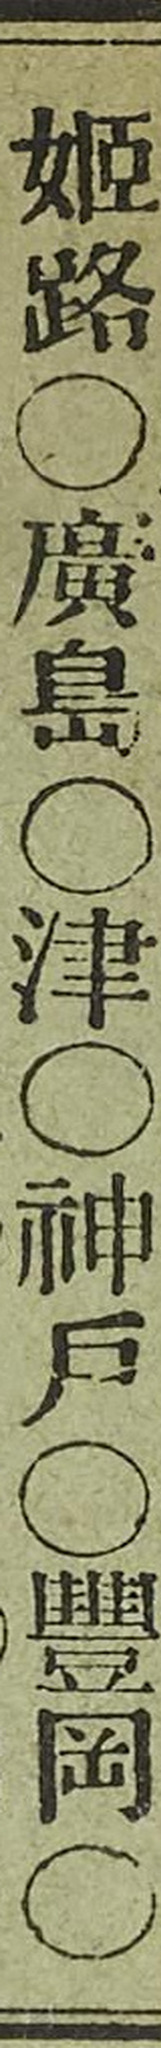姫路○広島○津○神戸○豊岡○
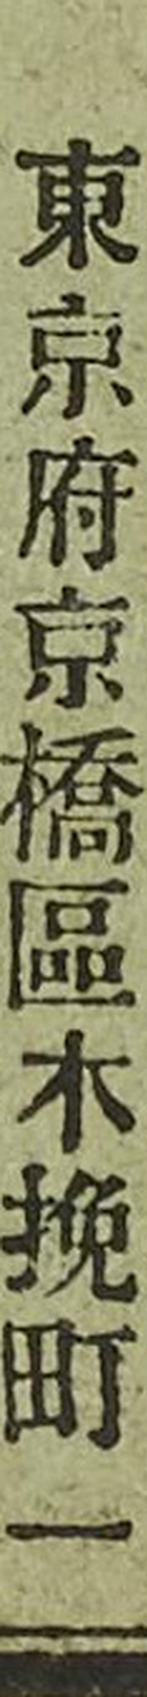東京府京橋区木挽町一
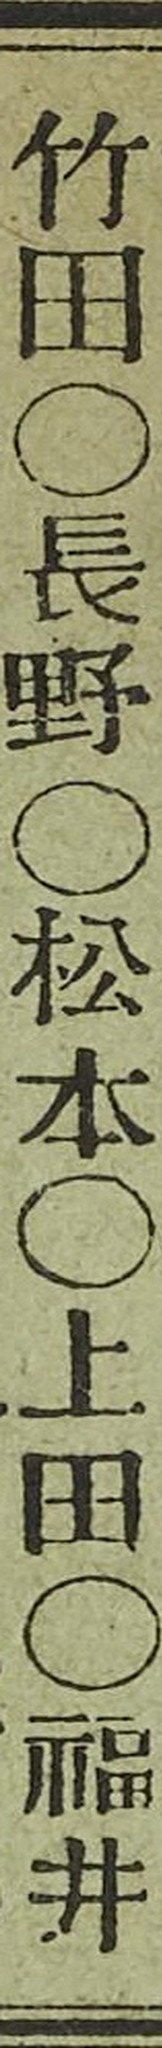竹田○長野○松本○上田○福井
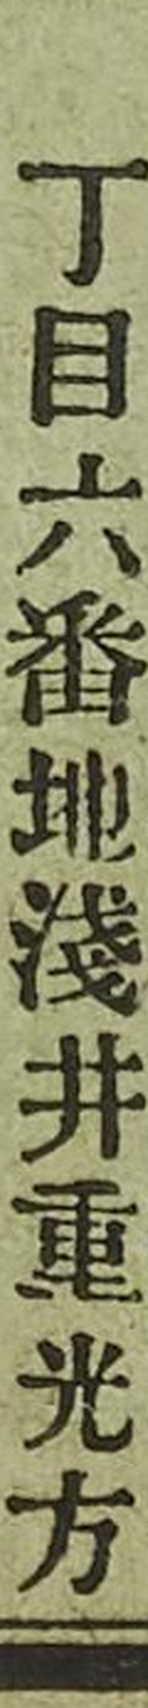丁目六番地浅井重光方
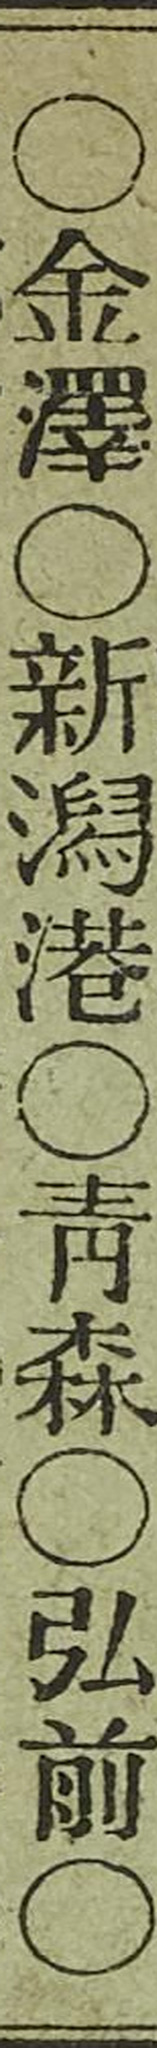○金沢○新潟港○青森○弘前○
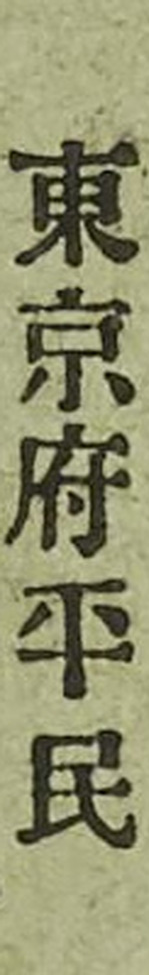東京府平民
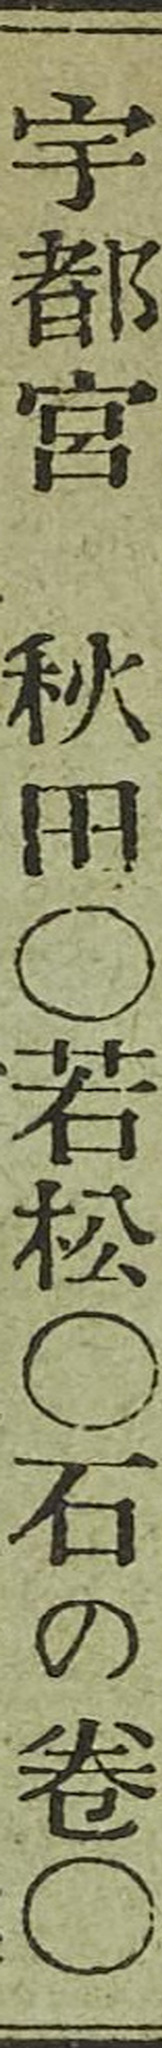宇都宮秋田○若松○石の巻○
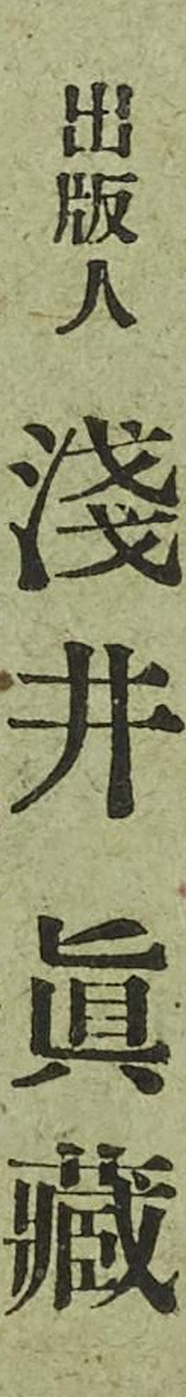出版人浅井眞藏
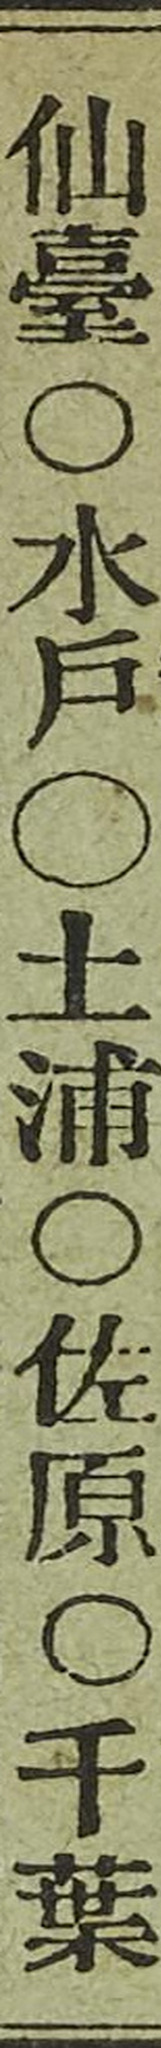仙台○水戸○土浦○佐原○千葉
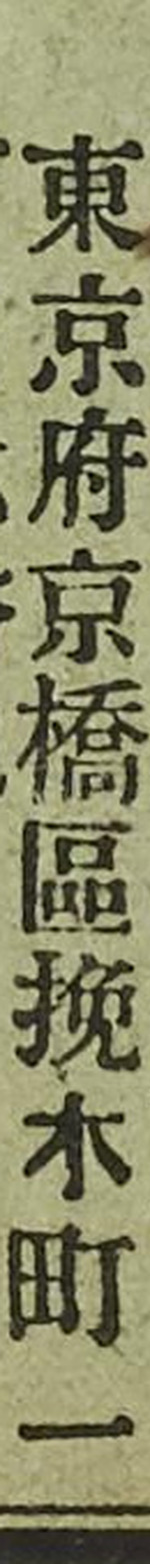東京府京橋区木挽町一
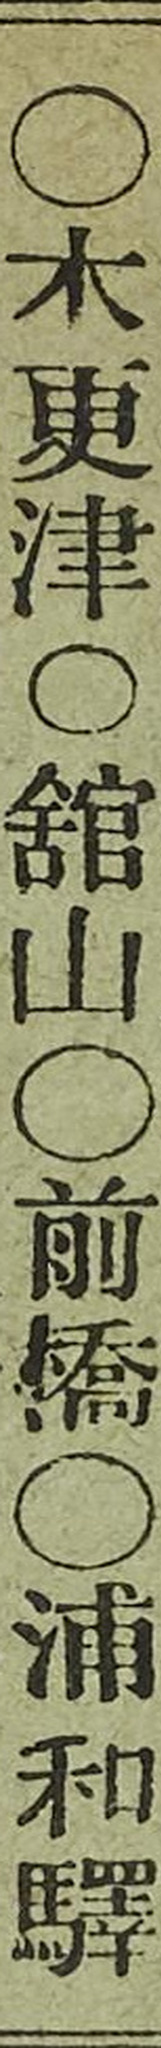○木更津○館山○前橋○浦和駅
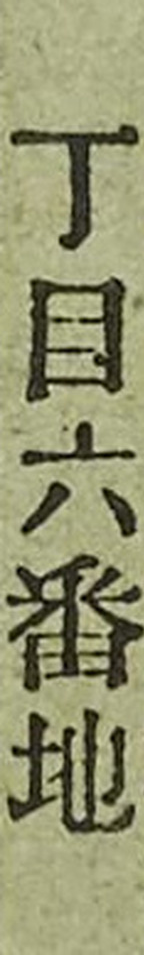丁目六番地
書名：永代惨話　文化の夢　全
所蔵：東京大学地震研究所図書室 Earthquake Research Institute Library, The University of Tokyo, JAPAN
